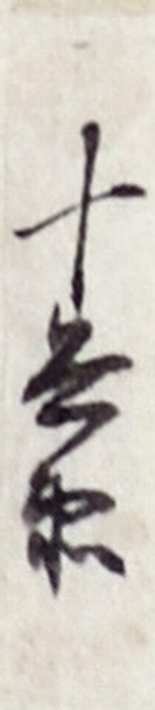新兵衛
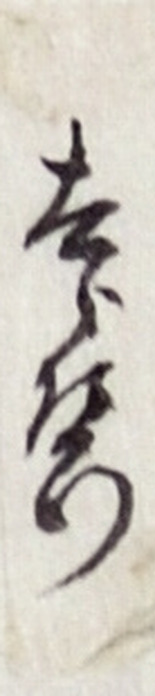作右衛門
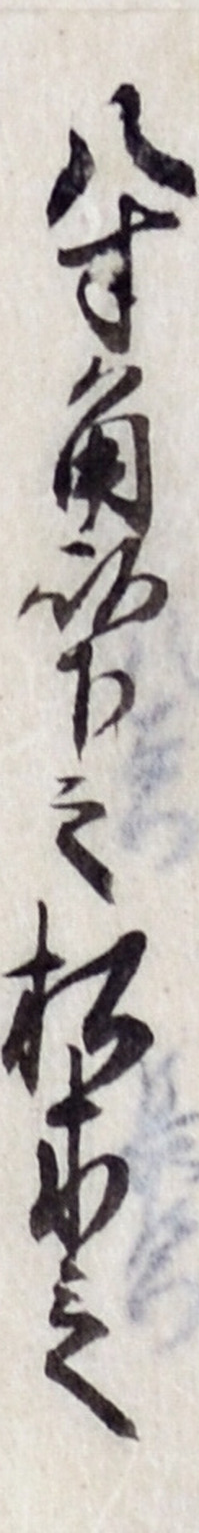八寸角以下之松木立
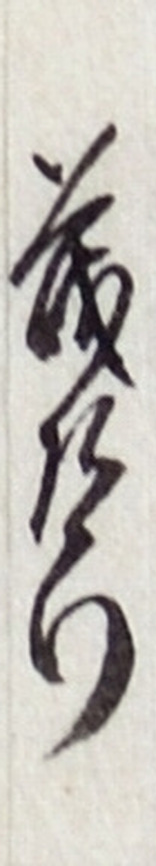茂左衛門
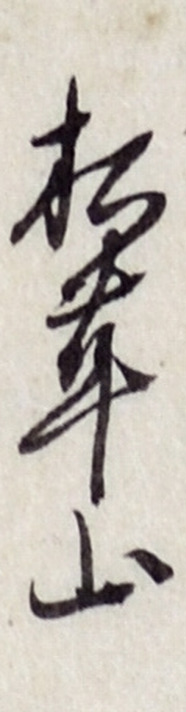松茸山
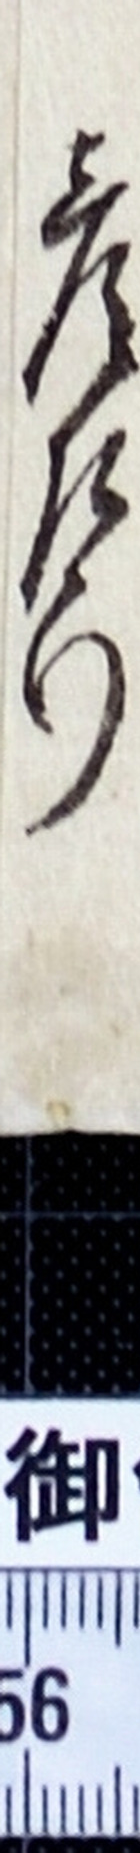彦左衛門
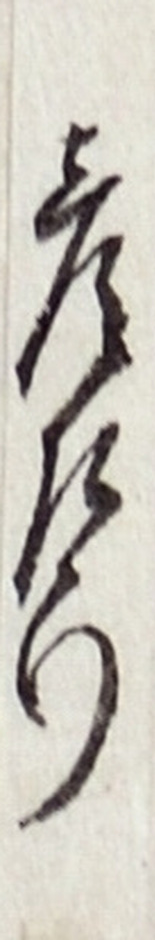彦左衛門
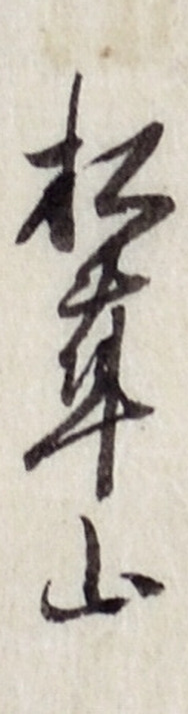松茸山
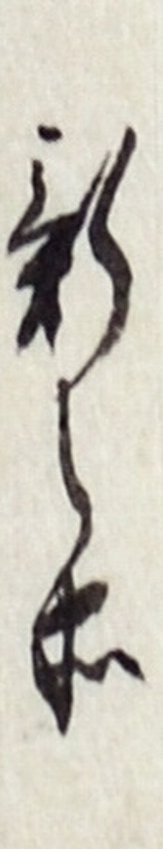新兵衛
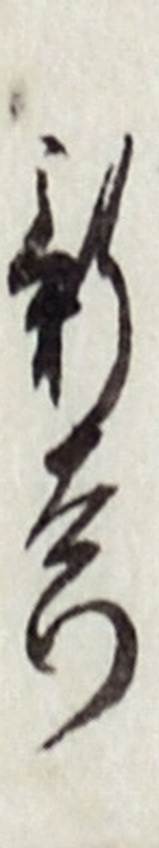新右衛門
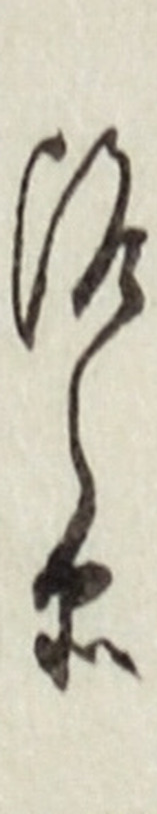治兵衛
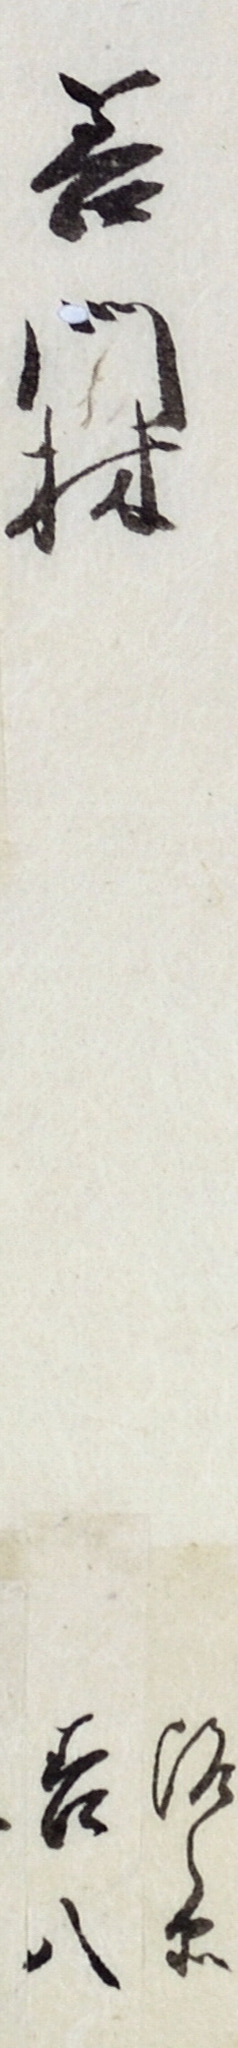善門林善八
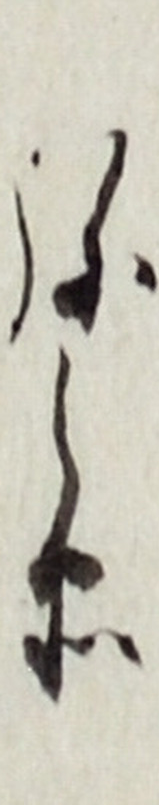新兵衛
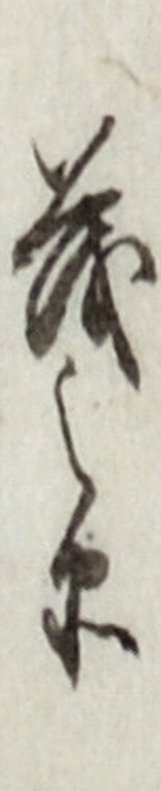茂兵衛
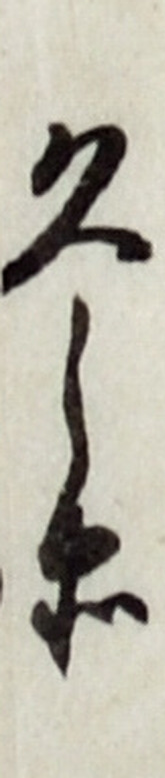久兵衛
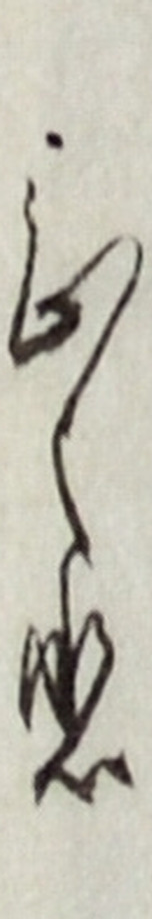新兵衛
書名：御領分中御林御藪附帳
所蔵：伊那市立高遠町図書館・合同会社AMANE
